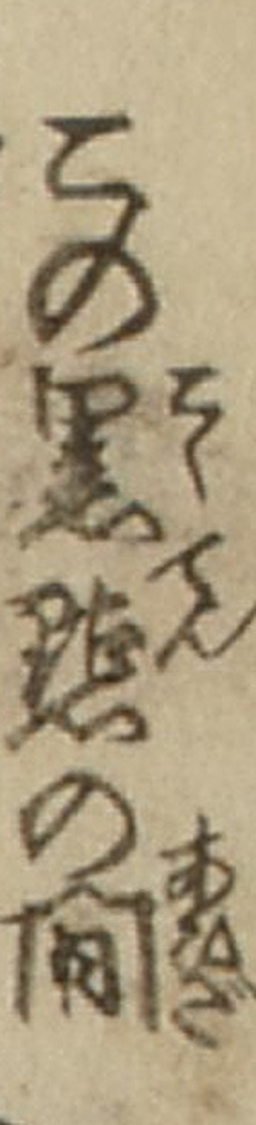この黒点の間
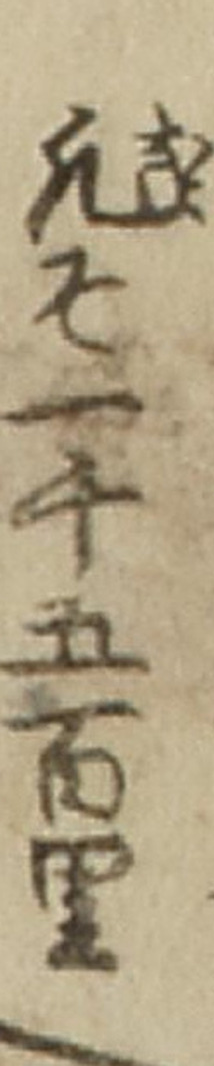凡そ一千五百里
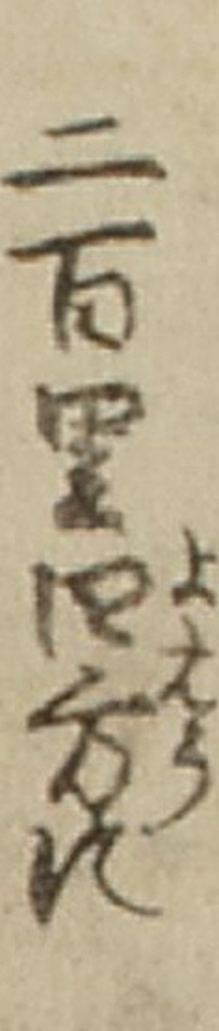二百里四方に
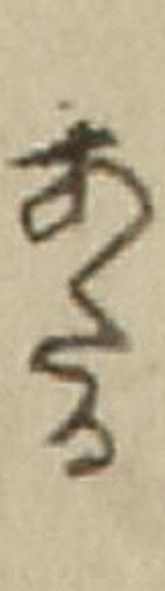あたる
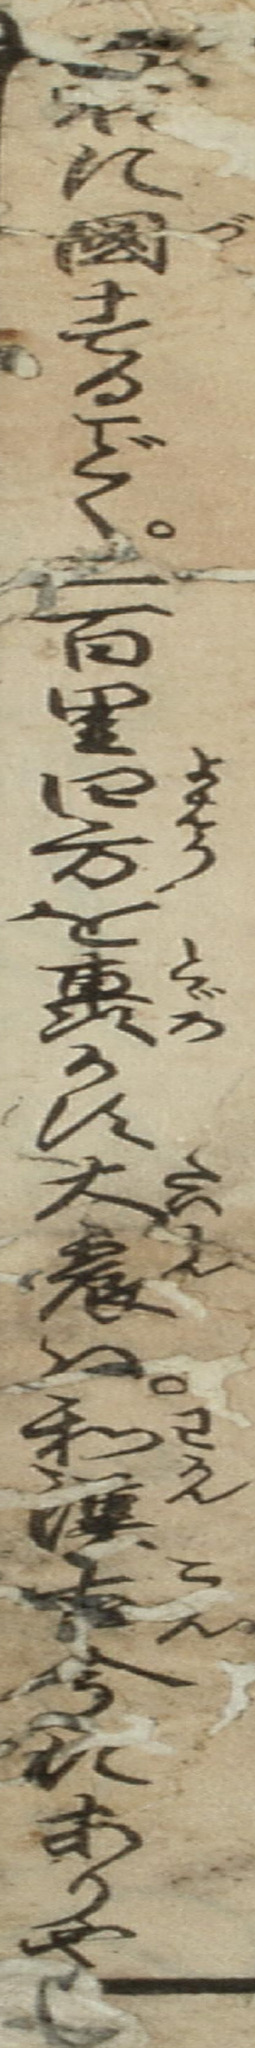右に図するごとく。二百里四方を轟かす大震は。和漢古今にありや
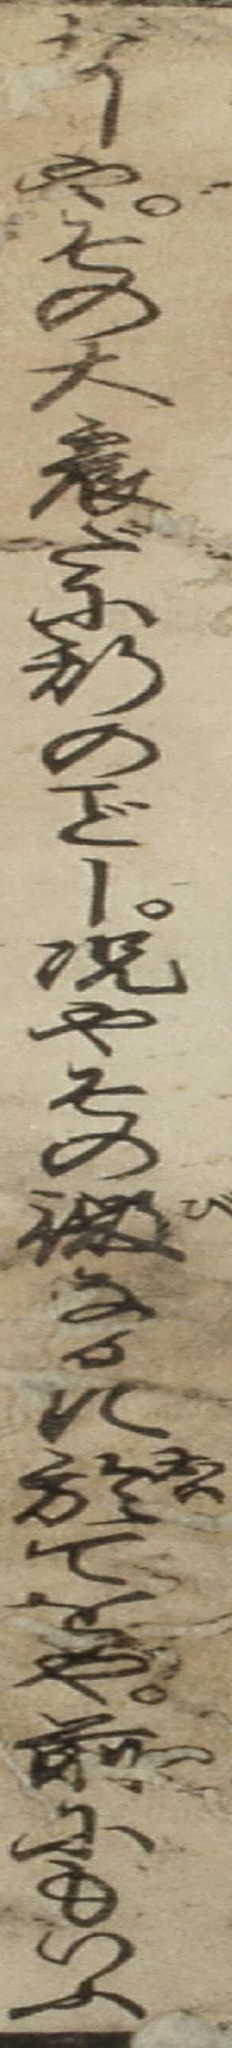なしや。その大震だに斯のごとし。況やその微なるに於てをや。前にもいふ
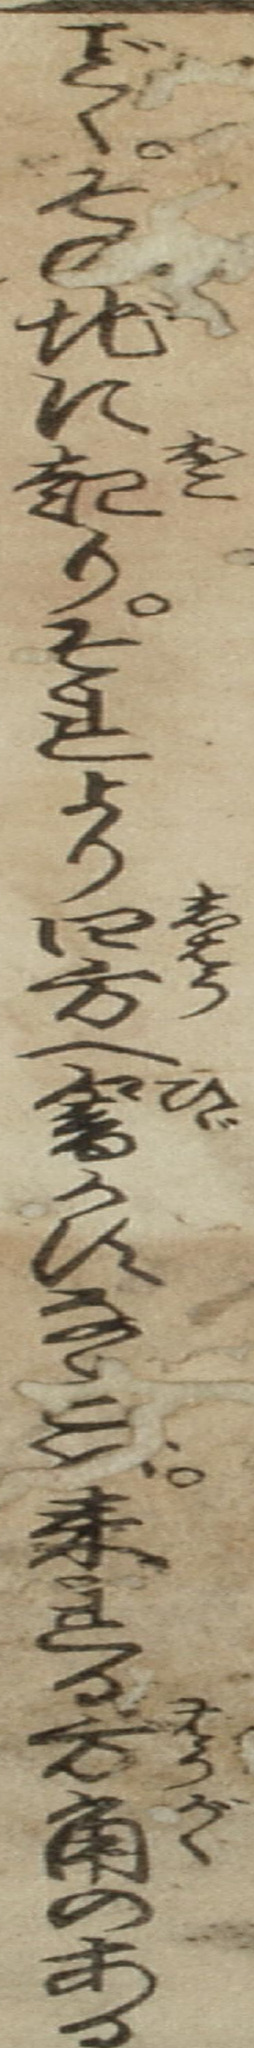ごとく。その地に起り。それより四方へ響かするれば。来れる方角のある
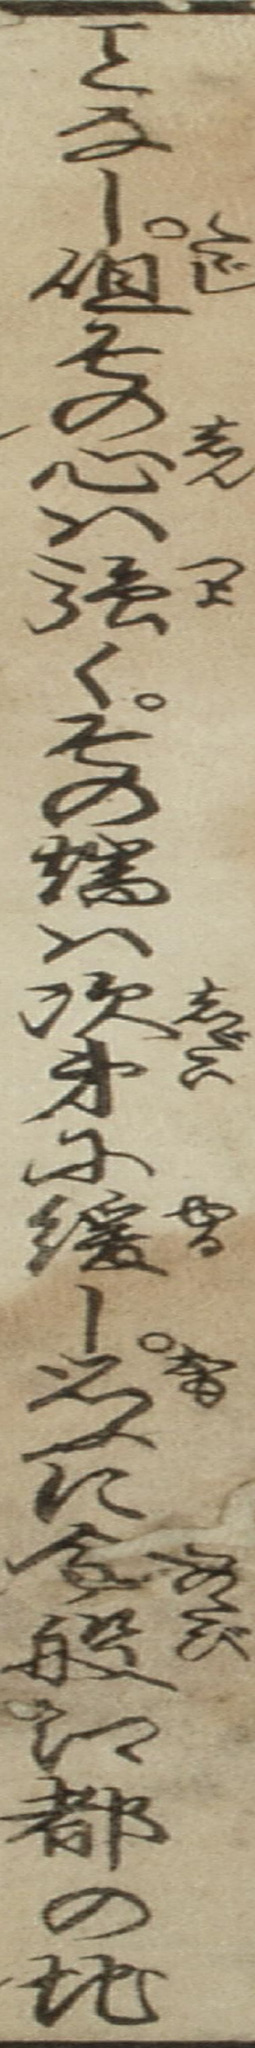ことなし。但その心は強く。その端は次第に緩し。思ふに今般江都の地
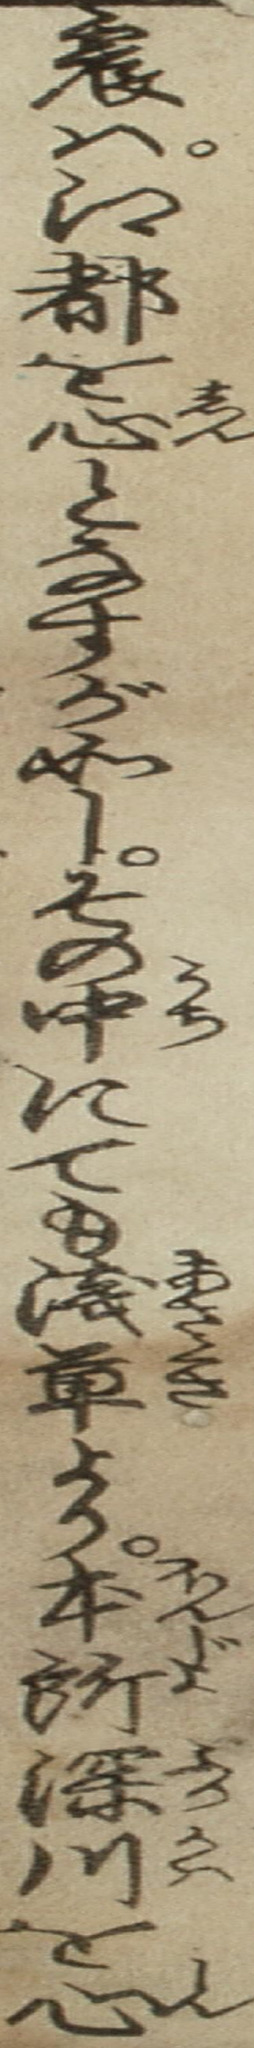震は。江都を心となすが如し。その中にても浅草より。本所深川を心
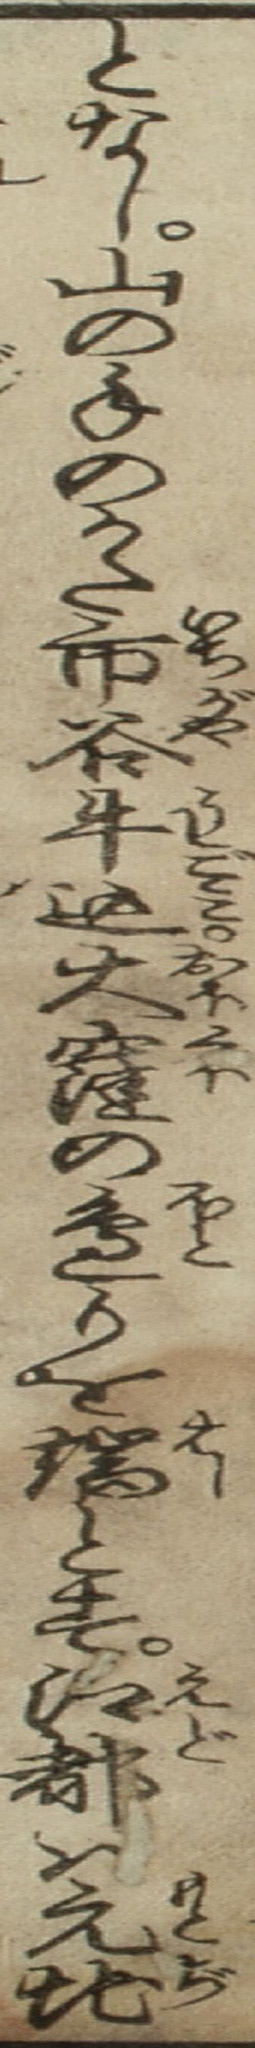となし。山の手のかた市谷牛込。大窪の辺りを端とす。江都は元地
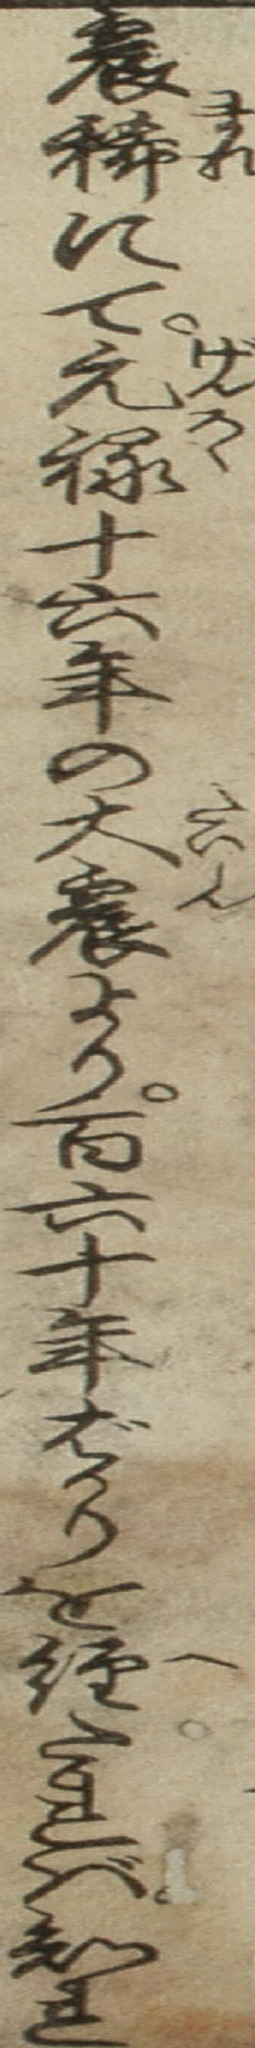震稀にて。元禄十六年の大震より。百六十年ばかりを経たれば。知れ
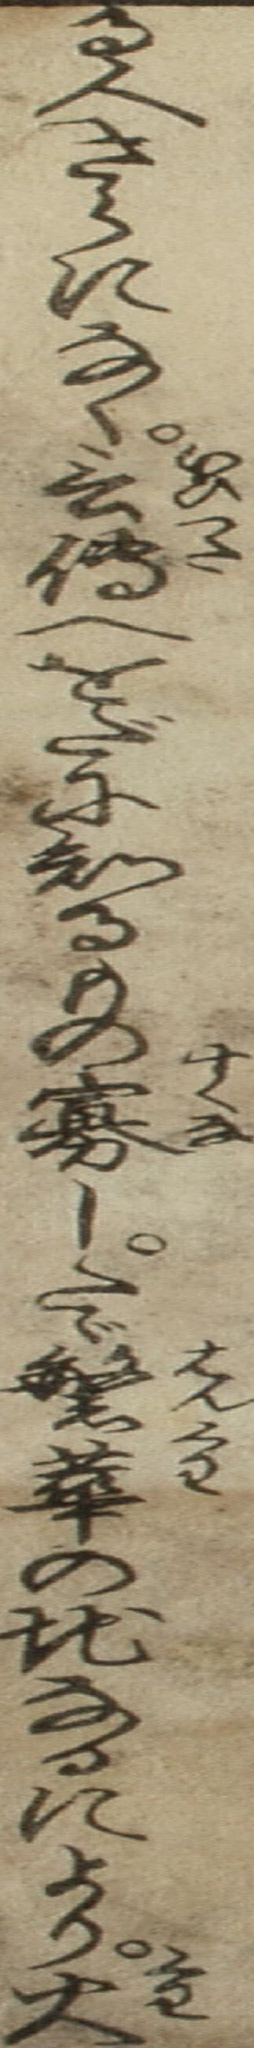る人さらになく。言伝へをだに知るもの寡し。ただ繁華の地なるにより。火
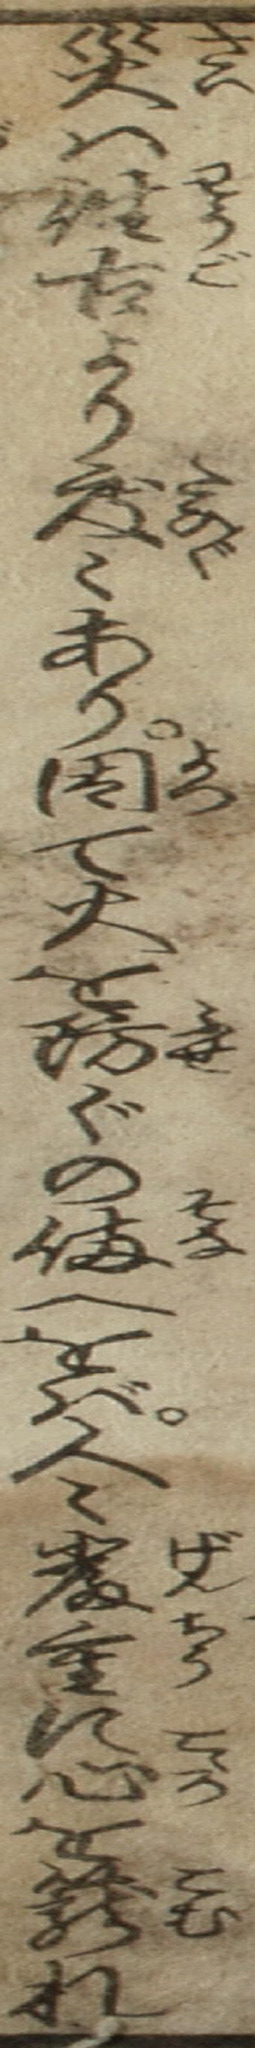災は往古より度〻あり。因て火を防ぐの備へをば。人〻厳重に心を籠れ
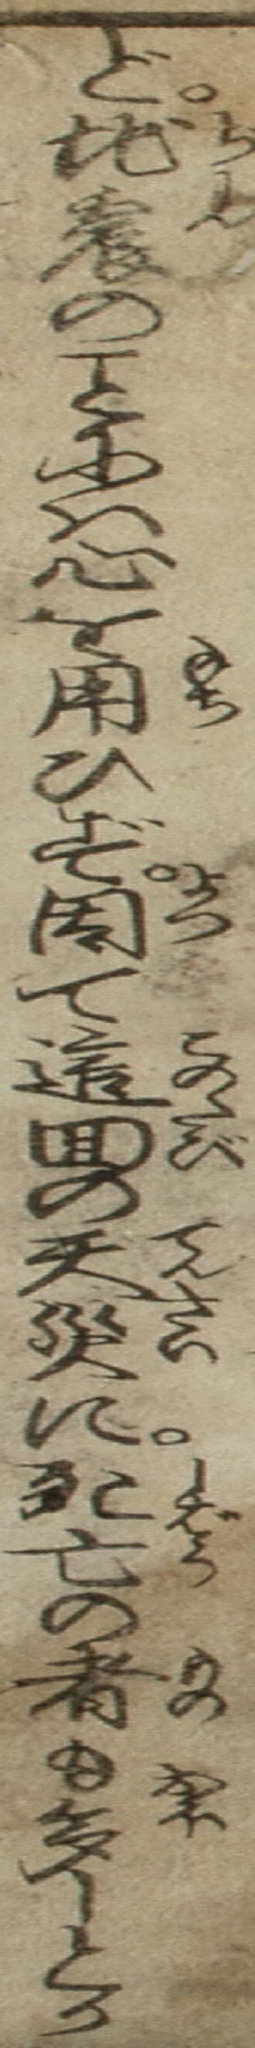ど。地震のことには心を用ひず。因て這回の天災に。死亡の者も多しとか
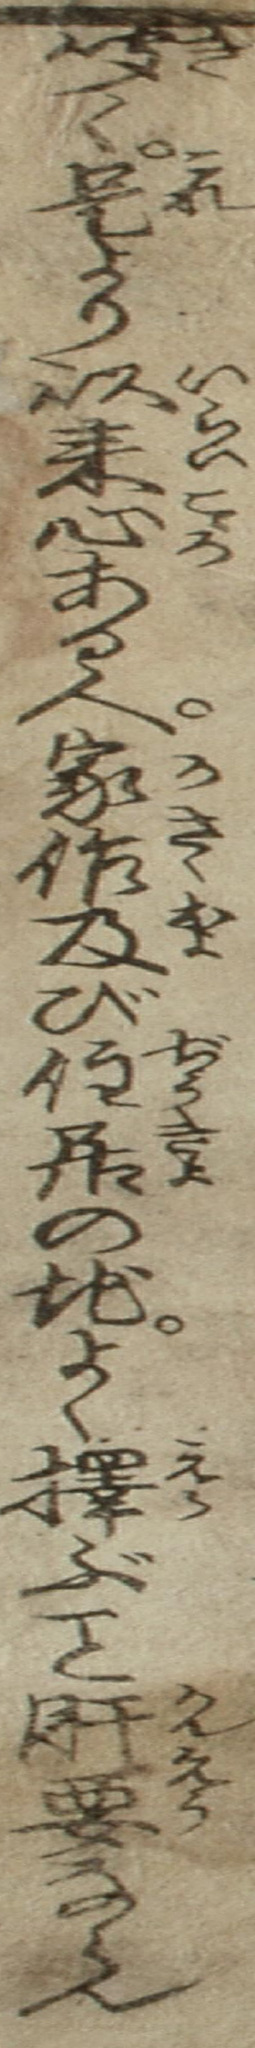聞く。是より以来心ある人。家作及び住居の地。よく択ぶこと肝要ならん
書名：安政見聞録　中
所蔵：東京大学地震研究所図書室 Earthquake Research Institute Library, The University of Tokyo, JAPAN
